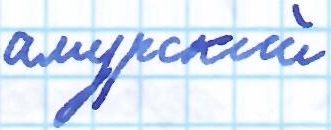амурский
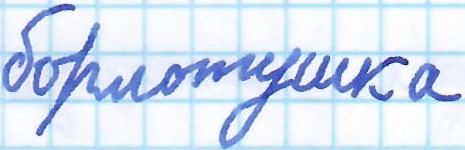бормотушка
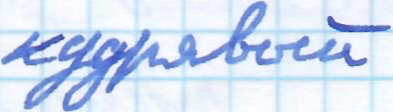кудрявый
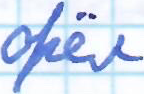орёл
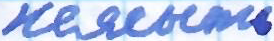неясыть
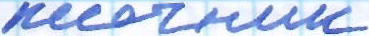песочник
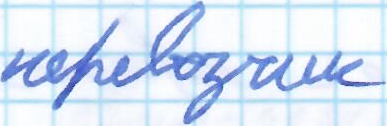перевозчик
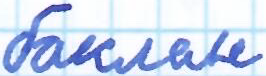баклан
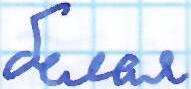белая
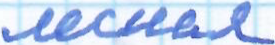лесная
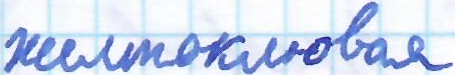желтоклювая
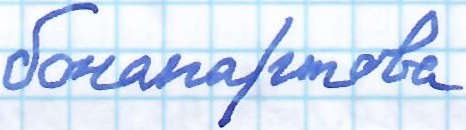бонапартова
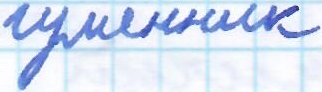гуменник
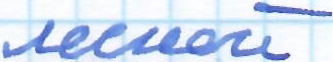лесной
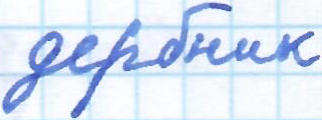дербник
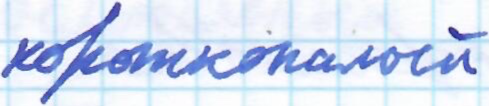короткопалый
